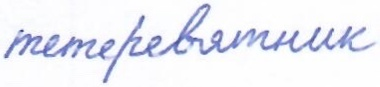тетеревятник
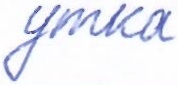утка
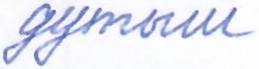дутыш
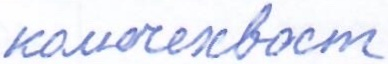колючехвост
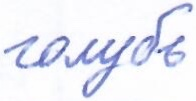голубь
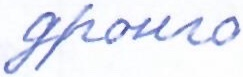дронго
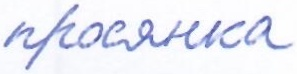просянка
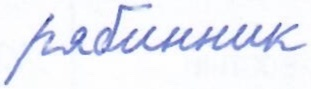рябинник
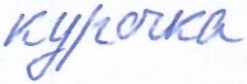курочка
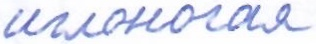иглоногая
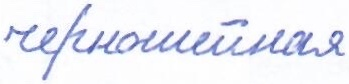черношейная
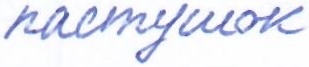пастушок
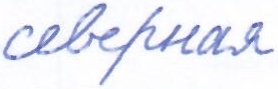северная
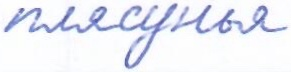плясунья
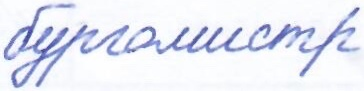бургомистр
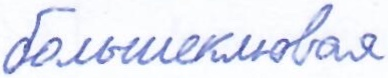большеклювая
